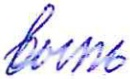выпь
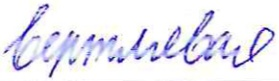вертлявая
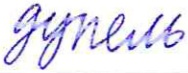дупель
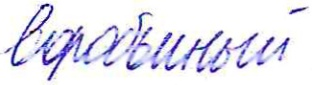воробьиный
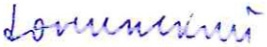бонинский
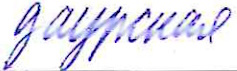даурская
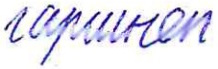гаршнеп
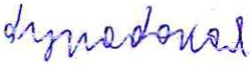бупобокая
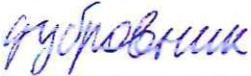дубровник
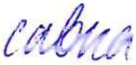савка
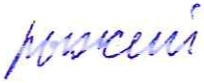рыжий
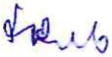бюль
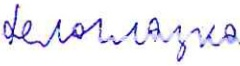белоглазка
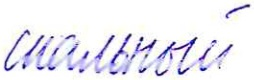скальный
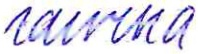гаичка
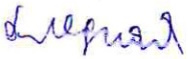бледная
